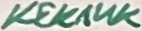кеклик
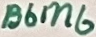выпь
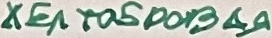желтобровая
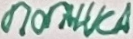поганка
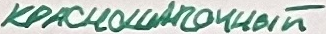красношапочный
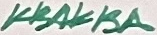кваква
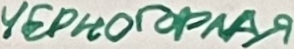черногорлая
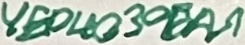чернозобая
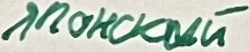японский
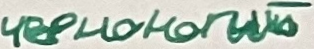черноногий
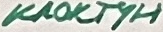клоктун
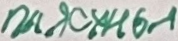плясунья
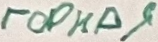горная
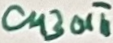сизый
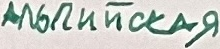альпийская
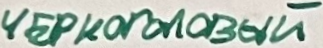черноголовый
